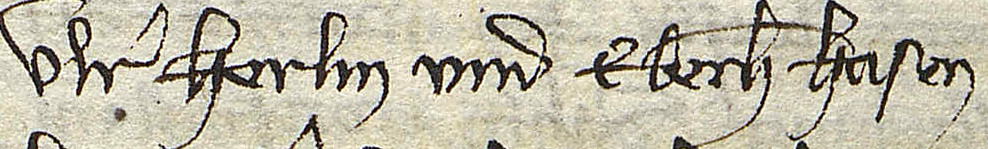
Vlr* Herlin vnd Eberh* Haſen
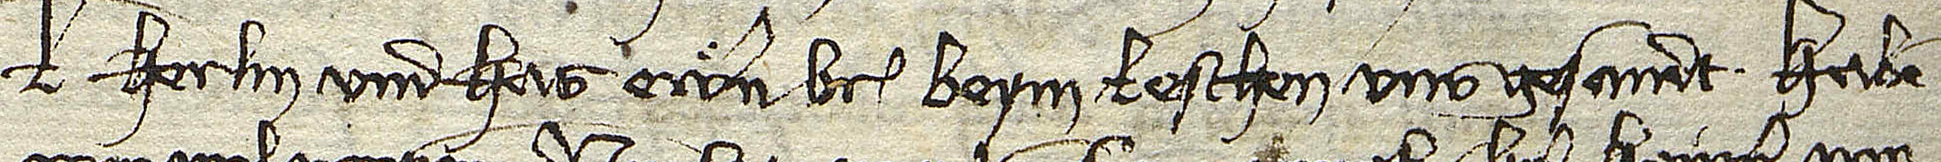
L* herlin vnd has ew*n br* beym Leſchen vns geſandt . Habe*
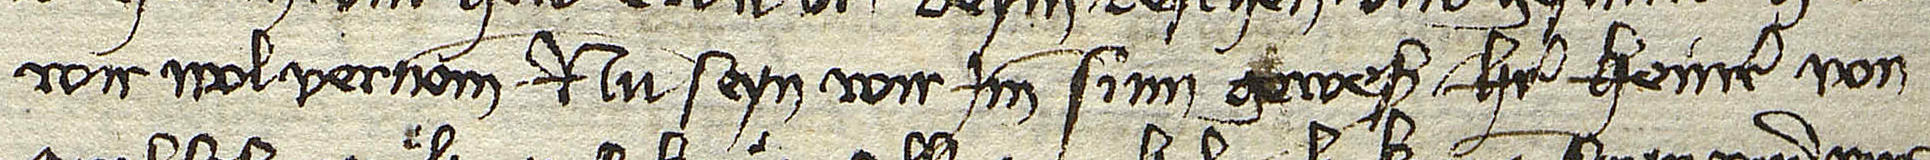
wir wol vernom* . Nu ſeyn wir Im* ſinn geweſ* hr* heinr* von
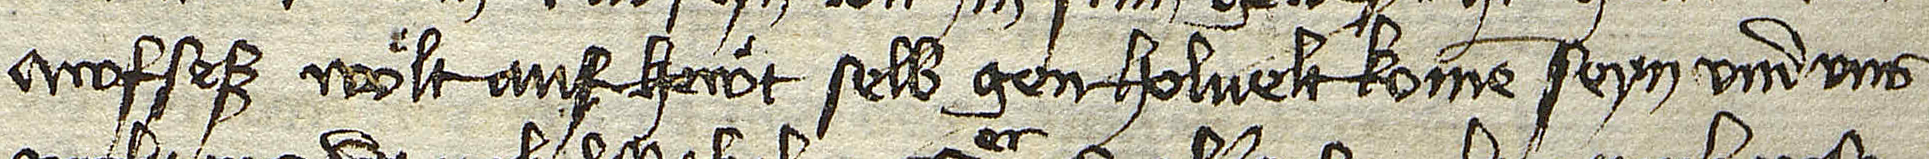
awfſeſʒ wölt auf hewt ſelb gen Holuelt kome* ſeyn vnd vns
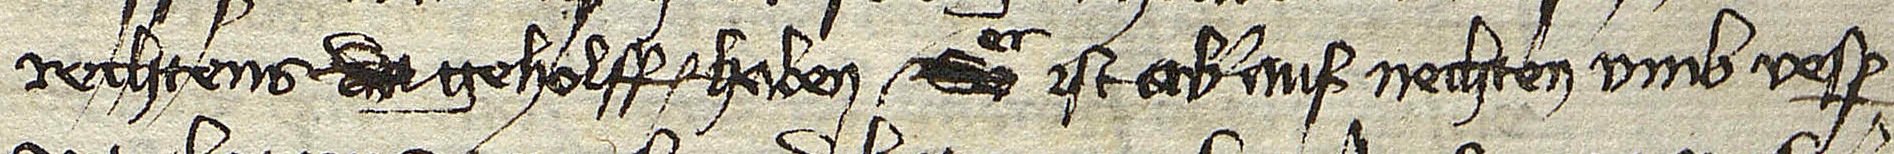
rechtens da geholff* haben / So iſt ab*auf nechten vmb veſp*
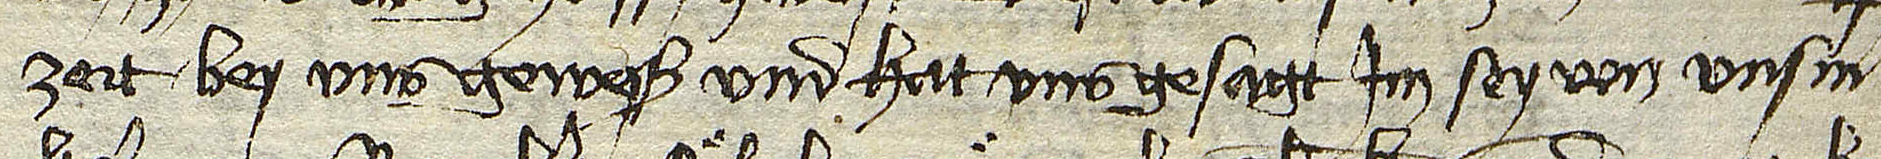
ʒeit / bey vns geweſ* vnd hat vns geſagt Im ſey von vnſ m*
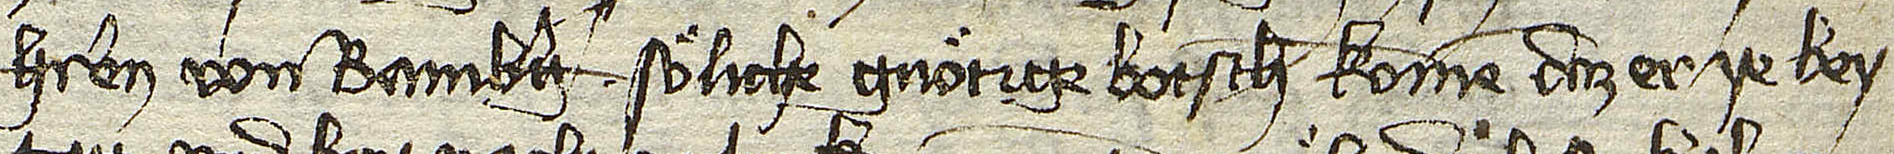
hr*en von Bamb*g . ſöliche gnötige botſch* kom*e daʒ er ye bey
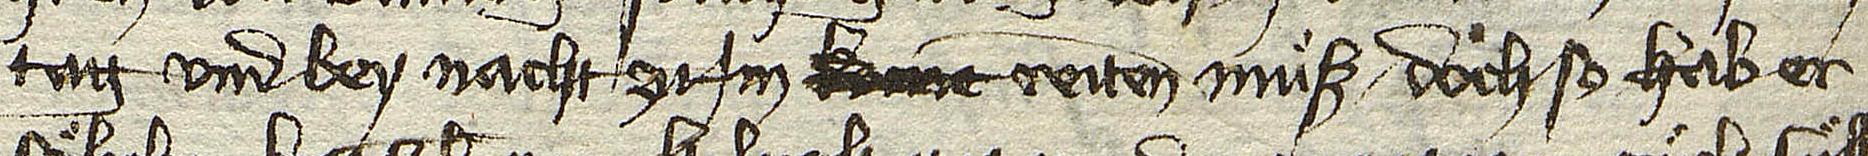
tag vnd bey nacht ʒu Im kome* reiten müſʒ / doch ſo hab er
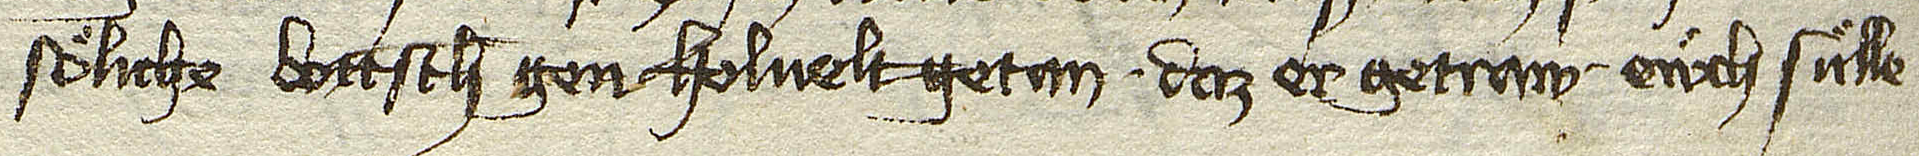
ſöliche bottſch* gen holuelt getan. daʒ er getraw . ewch ſülle
